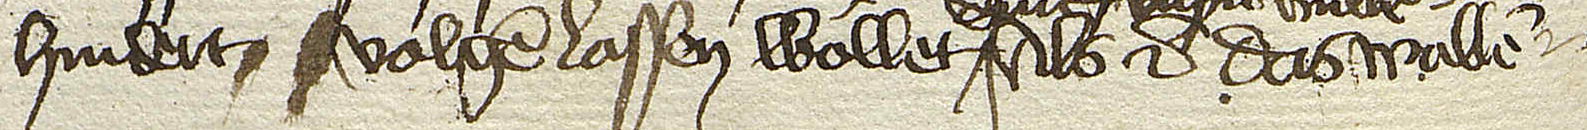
hindert volge* laſſen wöllet Als ec* das wölle* ec*
